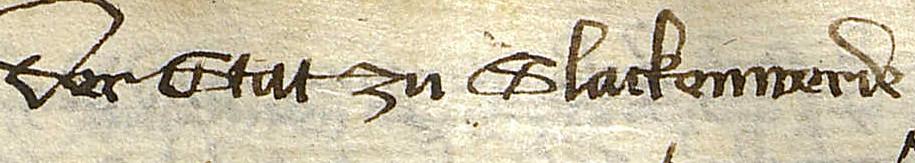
Der Stat ʒu Slackenwerde
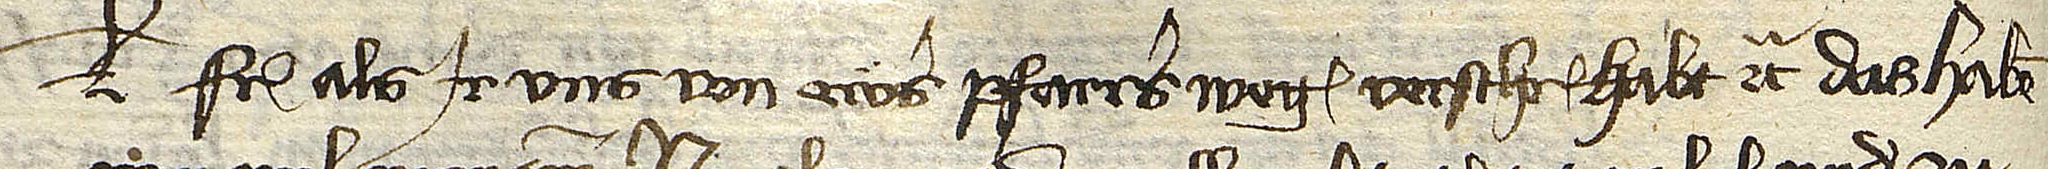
L* fr* als Ir vns von ew*s pfarr*s weg* verſchr* habt ec* das habe*
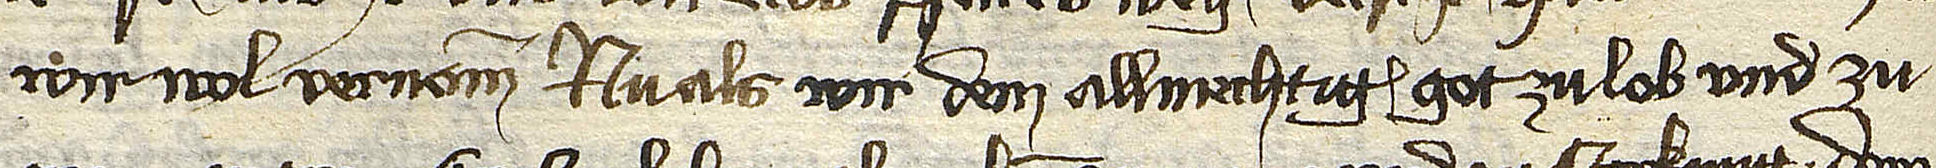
wir wol vernom* Nu als wir dem allmechtig* got ʒu lob vnd ʒu
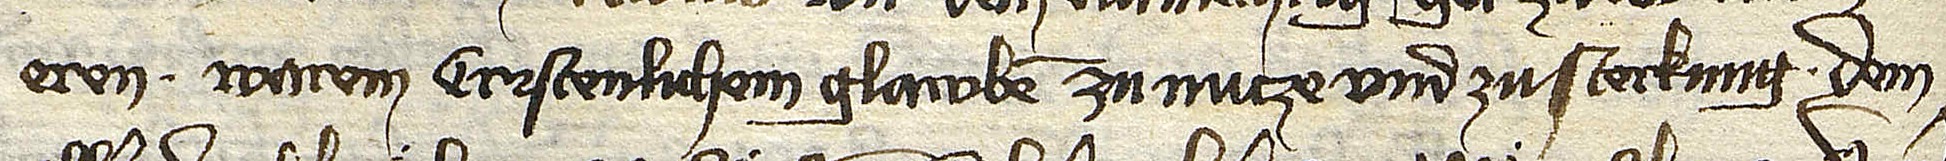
eren . warem Criſtenlichem glawbe* ʒu nucʒe vnd ʒu ſterkung . dem
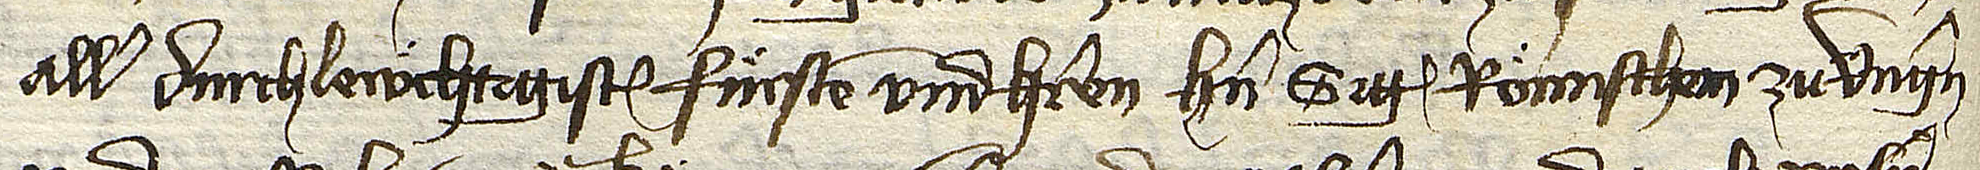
all* durchlewchtigiſt* fürſte* vnd h*ren h*n Sig* Römiſchen ʒu Vng*n
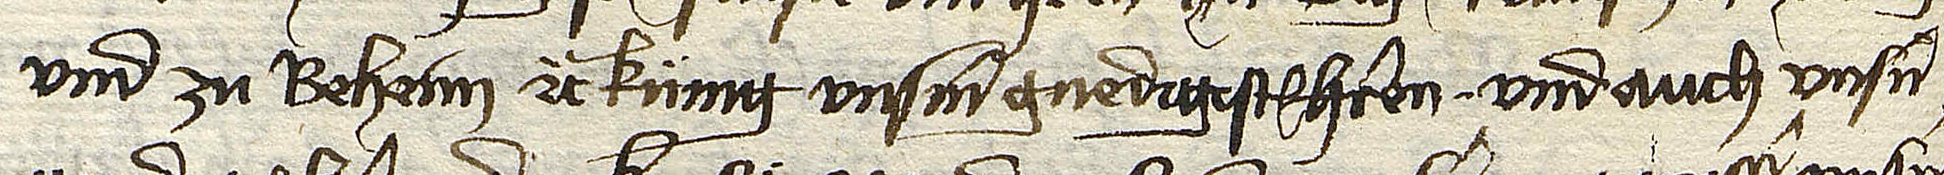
vnd ʒu Beheim ec* künig vnſ*m gnedigiſt* h*ren . vnd auch vnſ*n
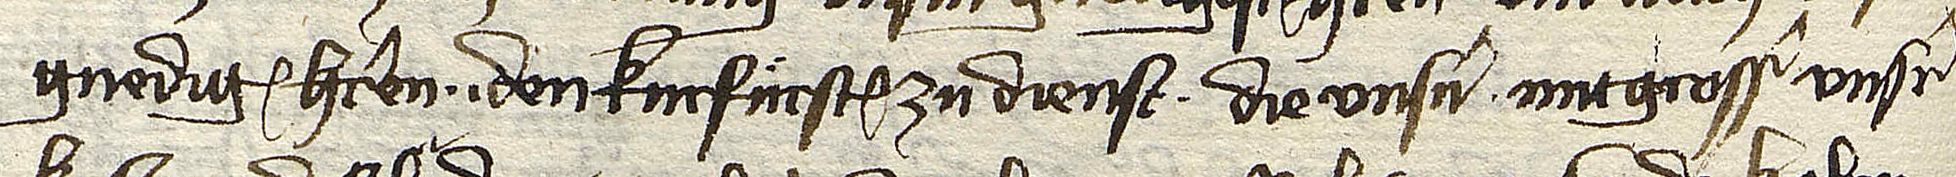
gnedig* h*ren ~ den kurfürſt* ʒu dienſt . die vnſ*n . mit groſſ* vnſ*r
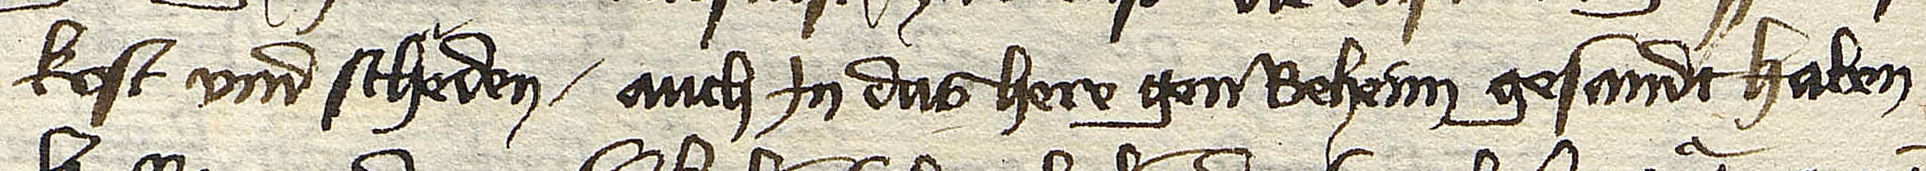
koſt vnd ſchëden / auch In das here gen Beheim geſandt haben
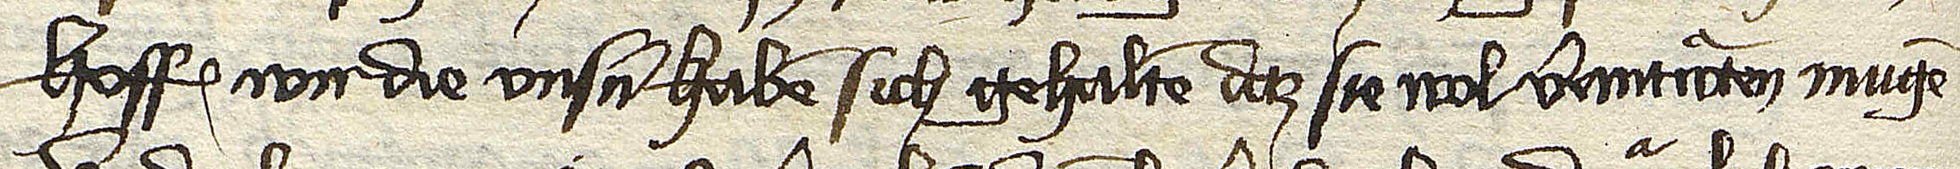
Hoff* wir die vnſ*n habe* ſich gehalte* daʒ ſie wol v*antw*ten muge*
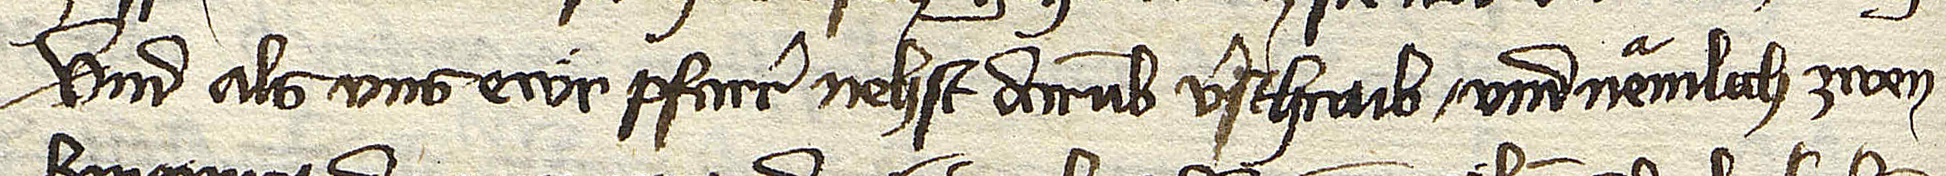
Vnd als vns ewr pfarr* nehſt daru*b v*ſchraib / vnd nëmlich ʒwen
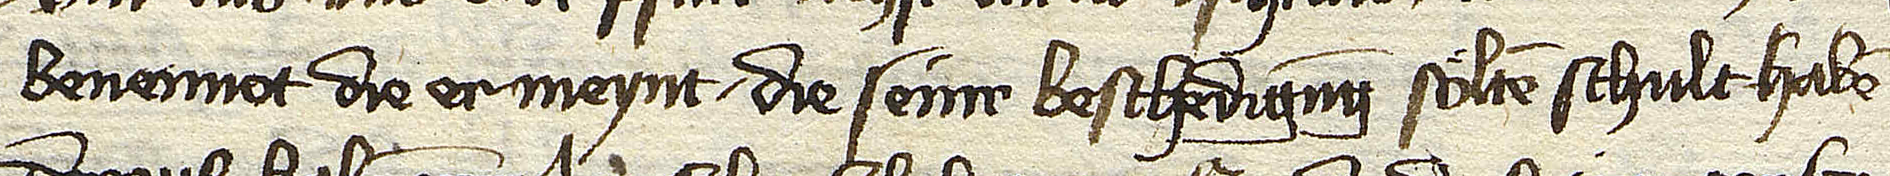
benennet die er meynt / die ſeinr beſchedigu*g ſölte* ſchult habe*
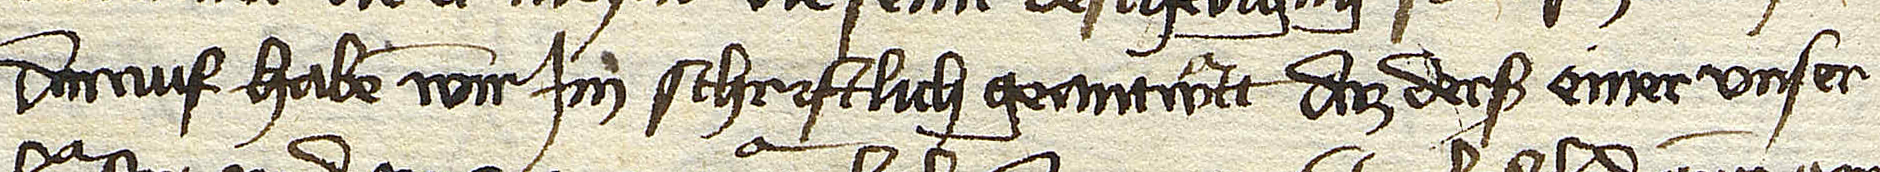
darauf habe* wir Im ſchriftlich geantw*tt daʒ derſ* einer vnſer
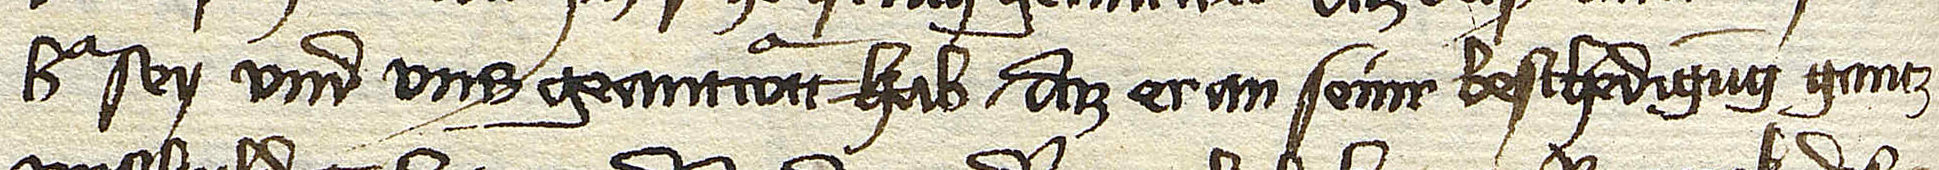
b* ſey vnd vns geantw*tt hab / daʒ er an ſeinr beſchedigu*g gancʒ
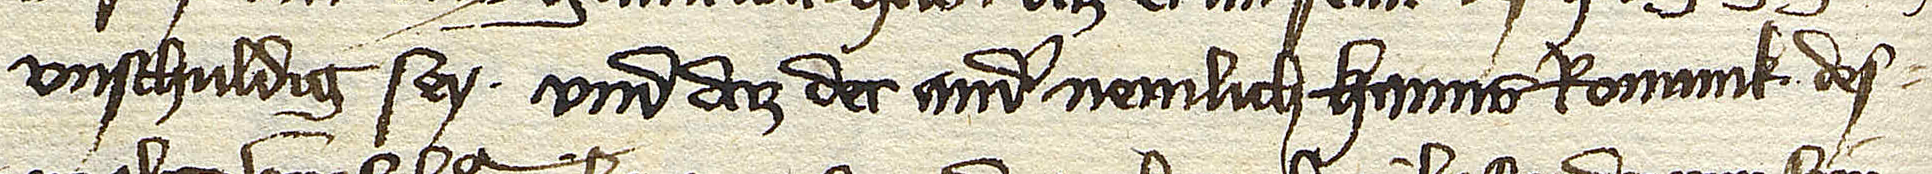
vnſchuldig ſey . vnd daʒ der and* nemlich hanns Rommik . deſ =
